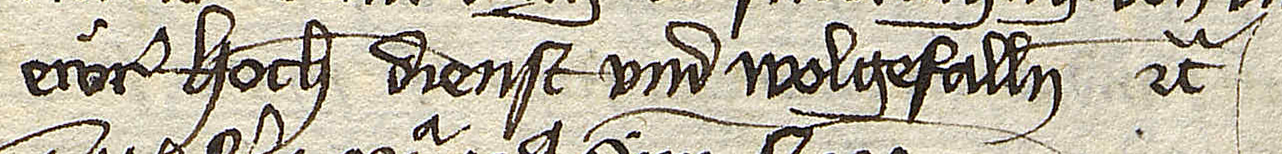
eẅr* hoch* dienſt vnd wolgefalln* ec*
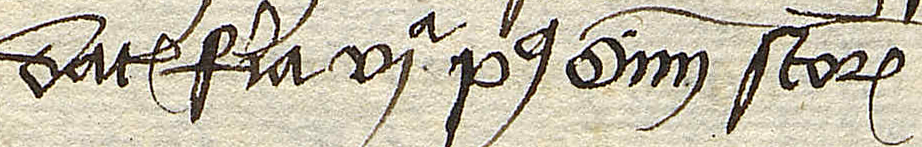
Dat* fi*a vi* p* Omi* ſco*
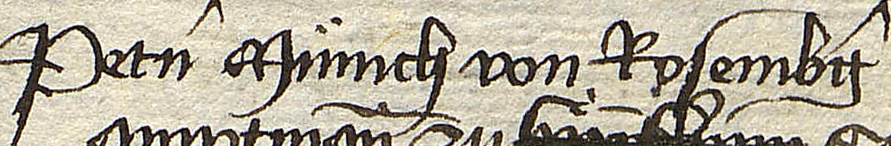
Petn* Münch von Roſemb*g
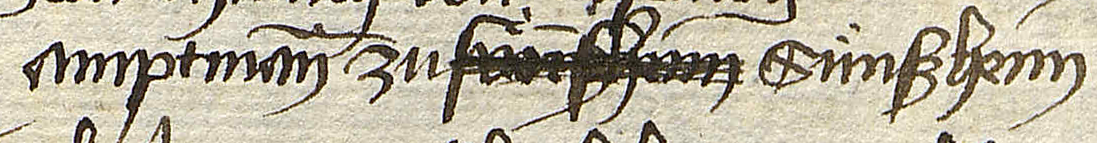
Amptman* ʒu ſẅrſheim Sünſʒheim
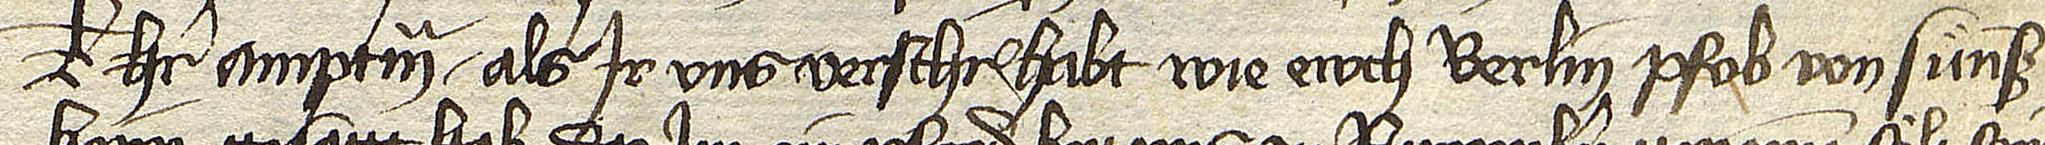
L* hr* amptm* / als Ir vns verſchr* habt wie ewch Berlin Pfob von ſünſʒ
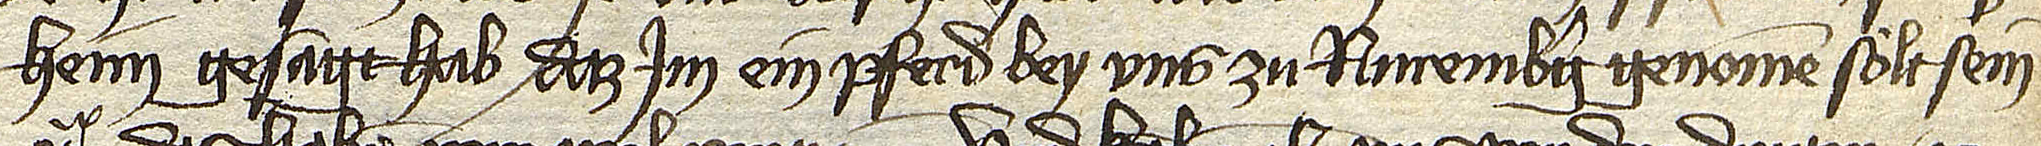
heim geſagt hab daʒ Im ein pferd bey vns ʒu Nuremb*g genome* ſölt ſein
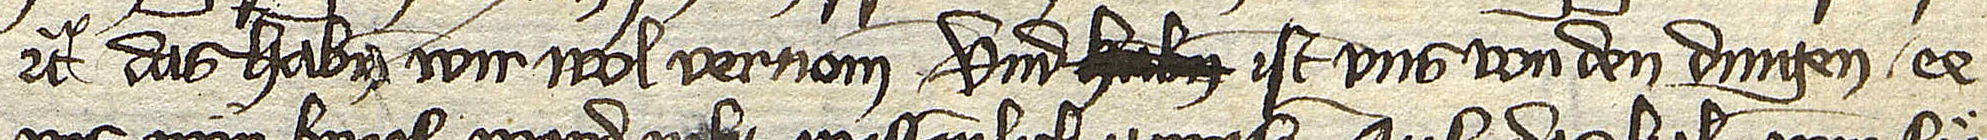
ec* das habn* wir wol vernom* / Vnd habn* iſt vns von den dingen / ee
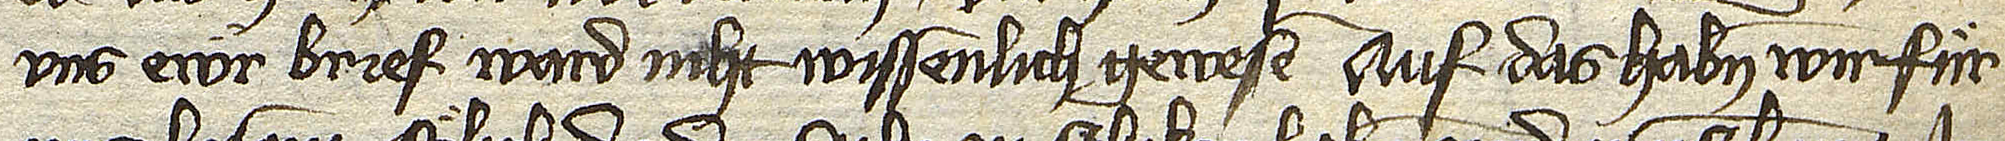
vns eẅr brief ward niht wiſſenlich geweſe* Auf das habn* wir für
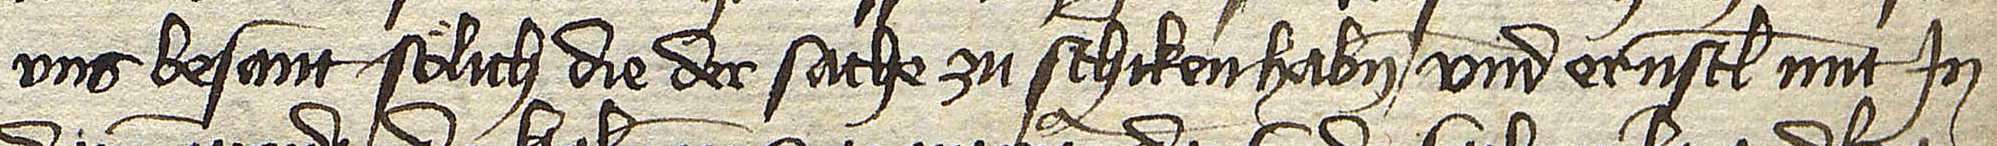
vns beſant / ſölich die der ſache ʒu ſchiken habn* vnd ernſtl* mit In
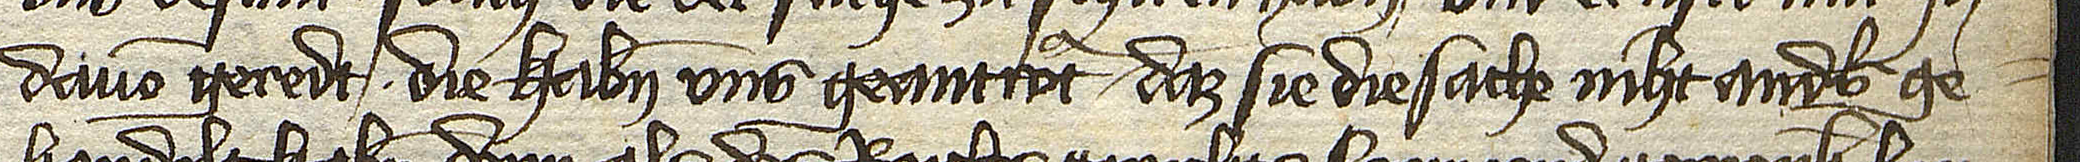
dauo* geredt . die habn* vns geantw*t / daʒ ſie die ſache niht and*s ge =
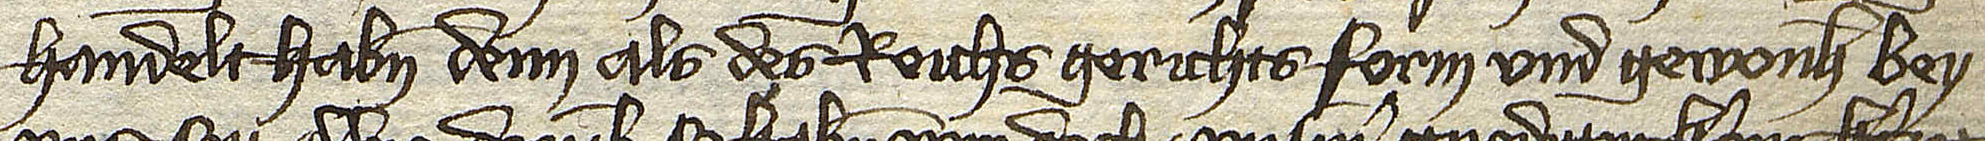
handelt habn* denn als des Reichs gerichts form vnd gewonh* bey
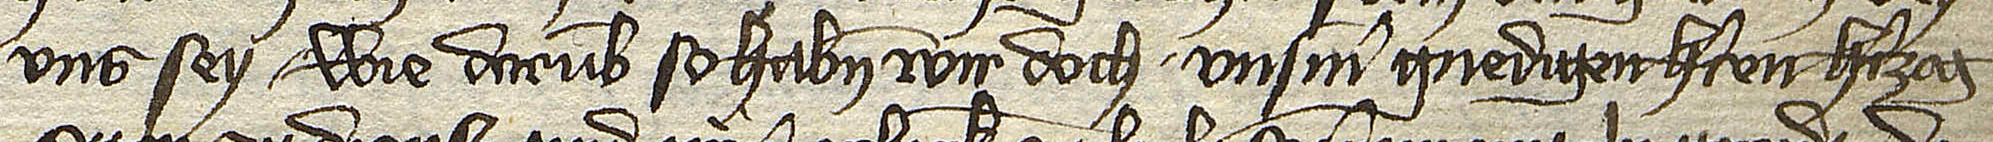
vns ſey / Wie darub* ſo habn* wir doch / vnſm* gnedigen h*ren h*cʒog
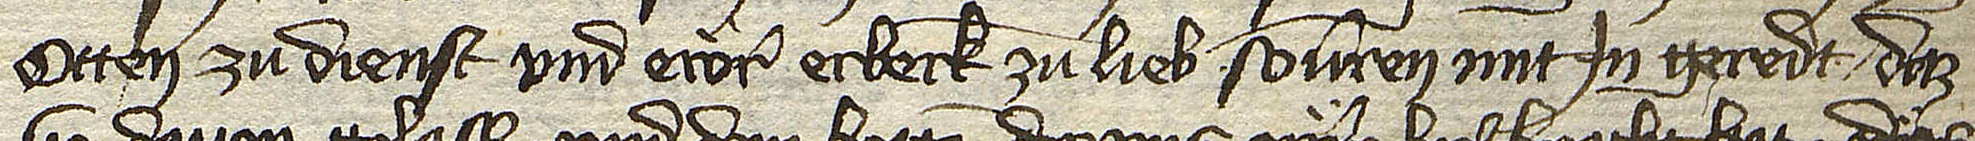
Otten ʒu dienſt vnd eẅr* erberk* ʒu lieb . ſou*ren mit In geredt / daʒ
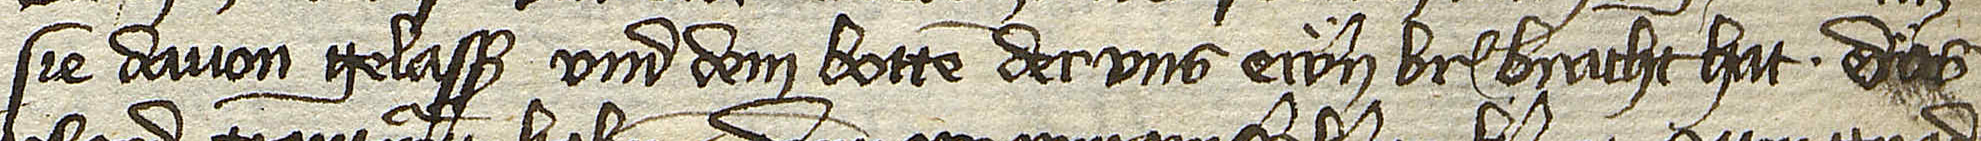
ſie dauon gelaſſ* vnd dem botte* der vns eẅ*n br* bracht hat . Das
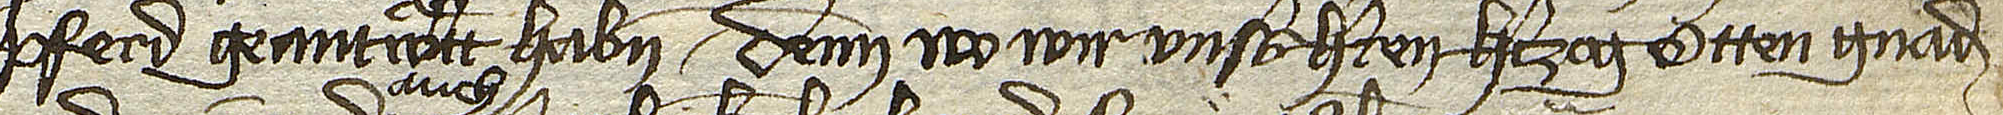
pferd geantw*tt habn* / Denn wo wir vnſ*s h*ren h*cʒog Otten gnad*
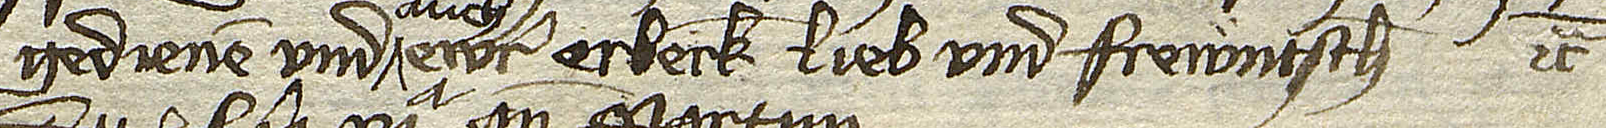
gediene* vnd ewr* erberk* lieb vnd freẅntſch* ec*
